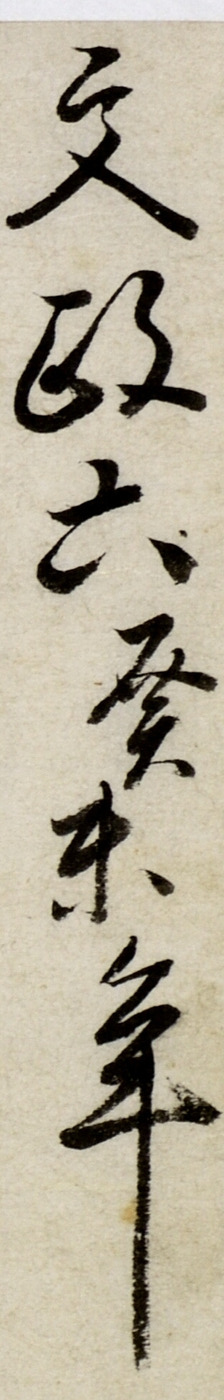文政六癸未年
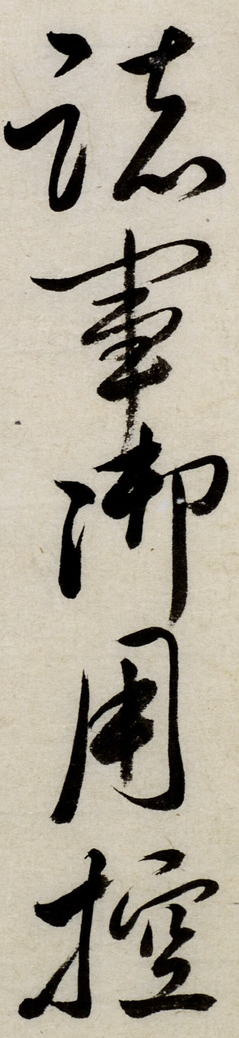諸事御用控
